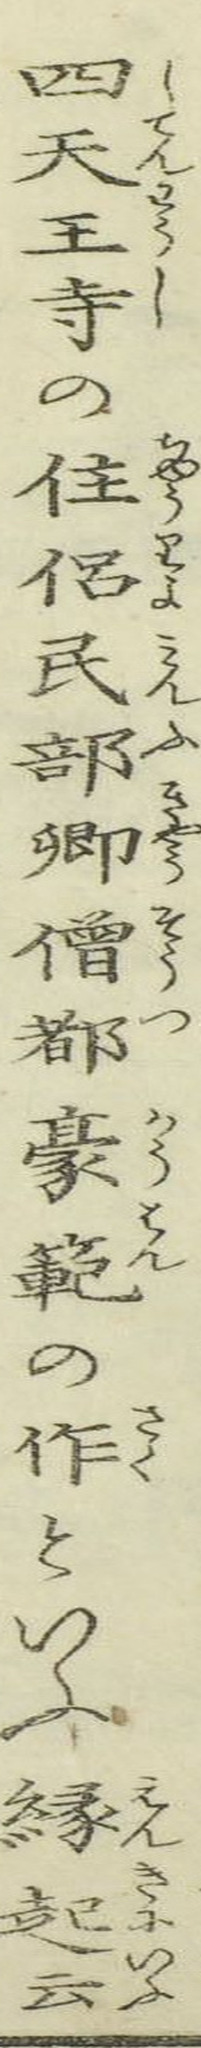四天王寺の住侶民部卿僧都豪範の作といふ縁起云
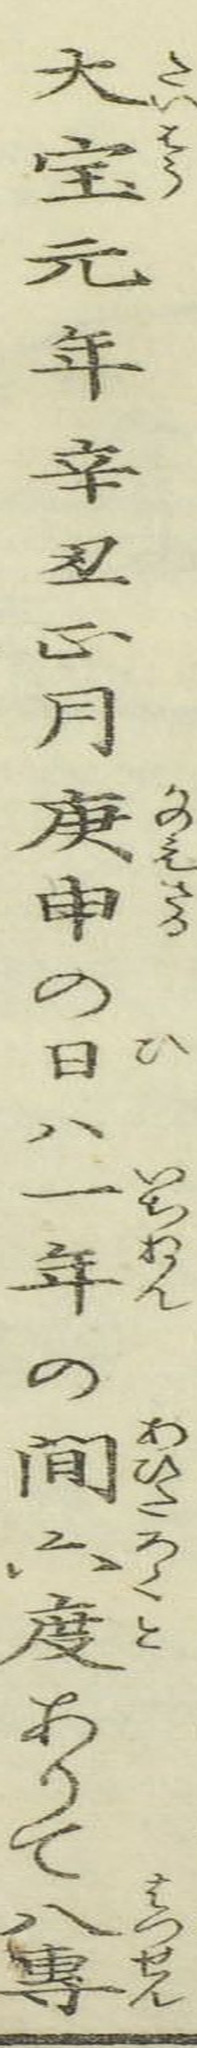大宝元年辛丑正月庚申の日は一年の間六度ありて八専
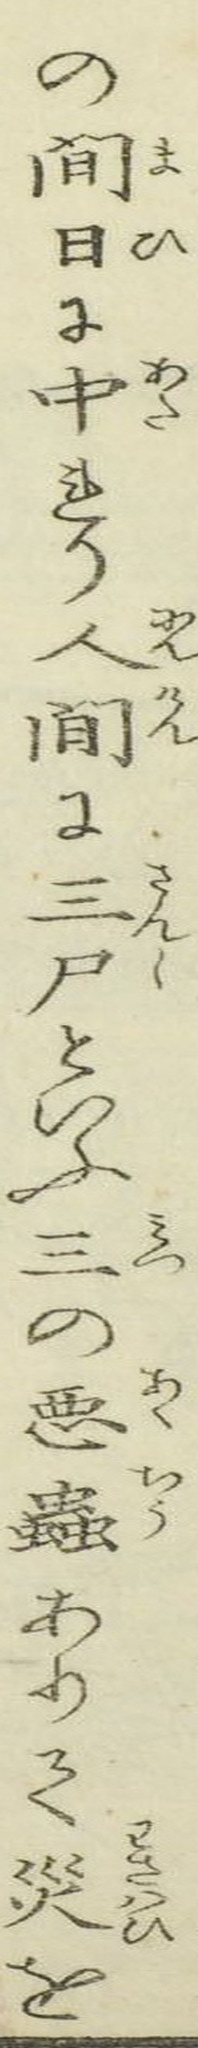の間日に中れり人間に三尸といふ三の悪蟲ありて災を
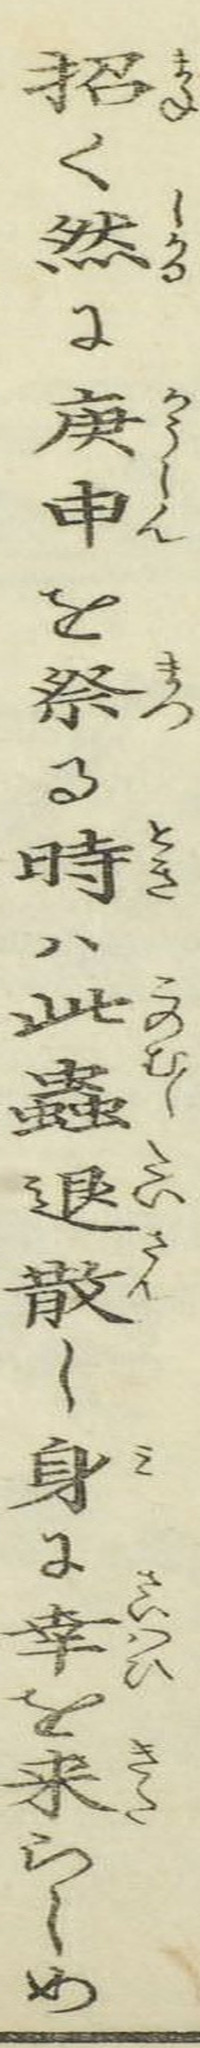招く然に庚申を祭る時は此蟲退散し身に幸を来らしめ
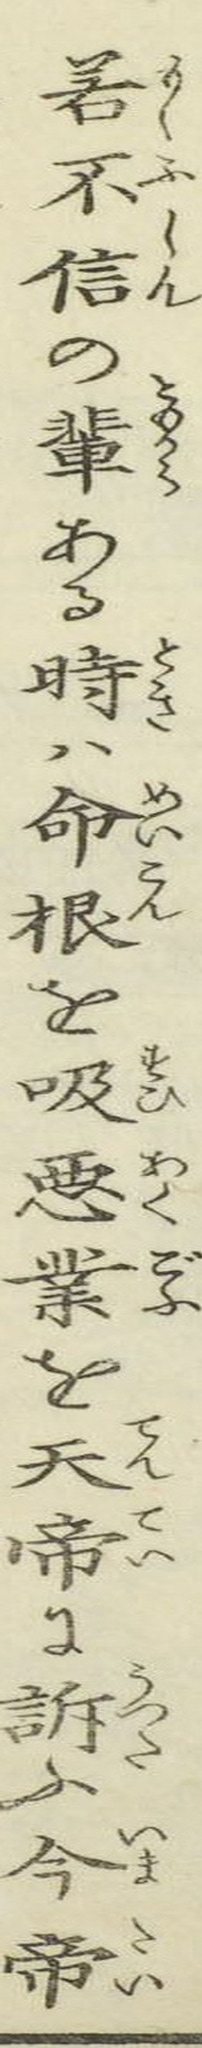若不信の輩ある時は命根を吸悪業を天帝に訴ふ今帝
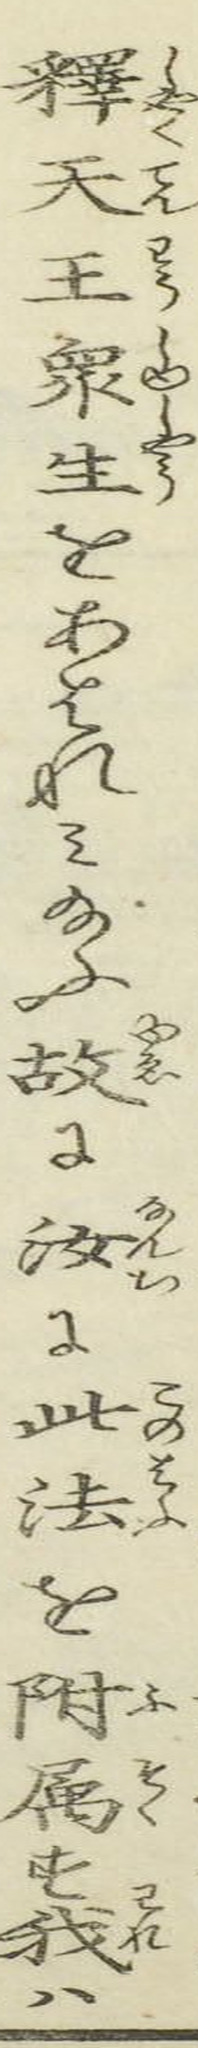釈天王衆生をあはれみ給ふ故に汝に此法を附属す我は
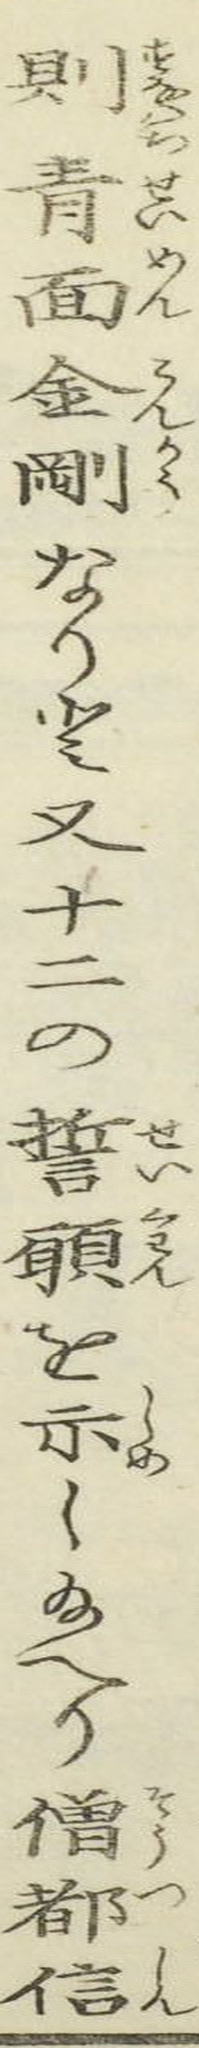則青面金剛なりと又十二の誓願を示し給へり僧都信
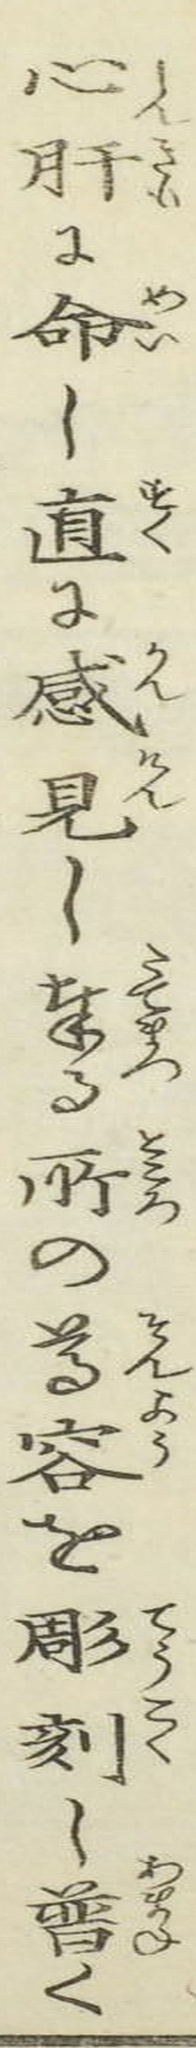心肝に命し直に感見し奉る所の尊容を彫刻し普く
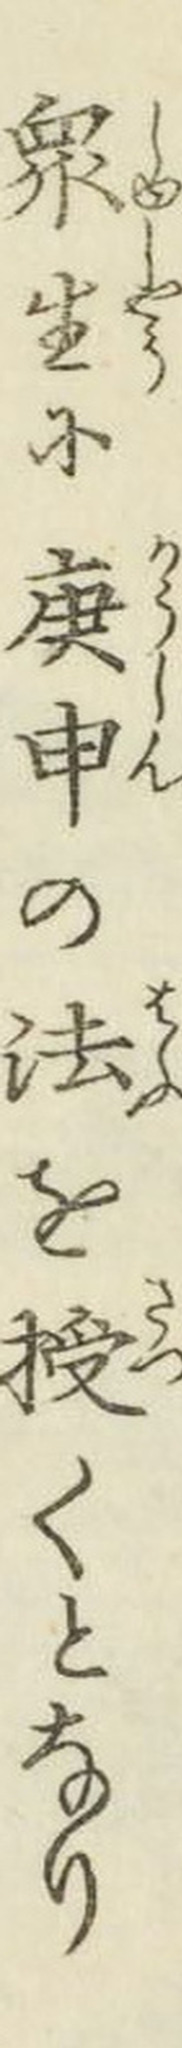衆生に庚申の法を授くとなり
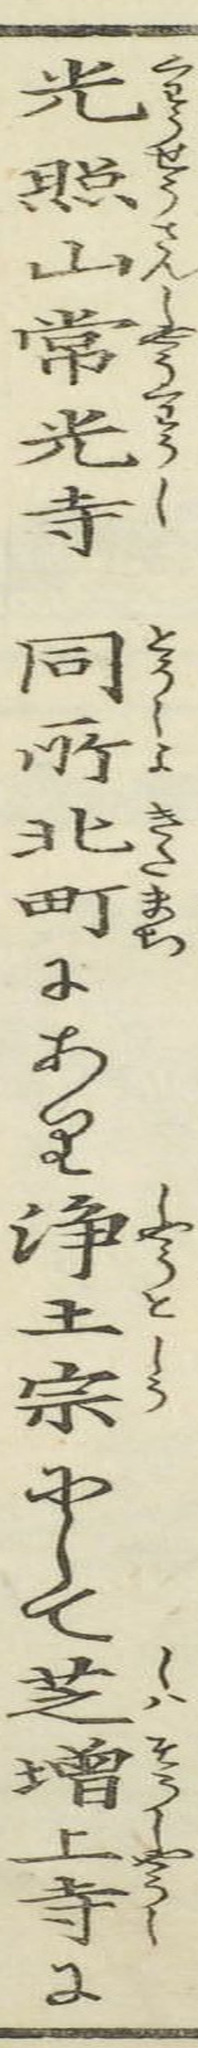光照山常光寺同所北町にあり浄土宗にして芝増上寺に
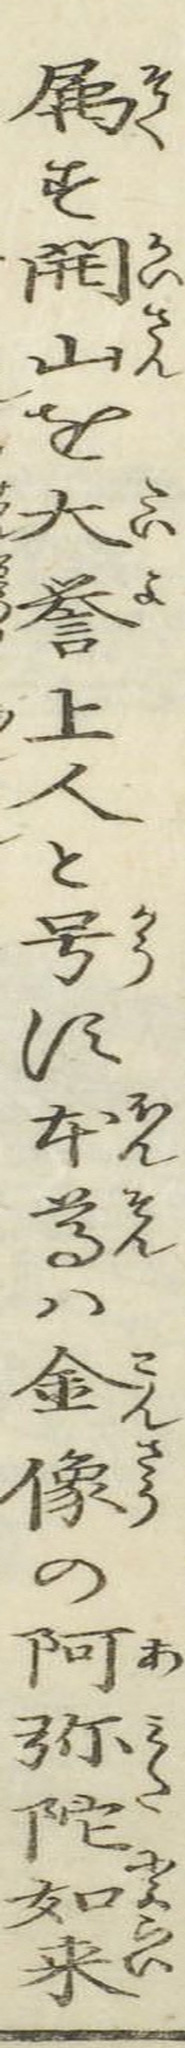属す開山を大誉上人と号す本尊は金像の阿弥陀如来
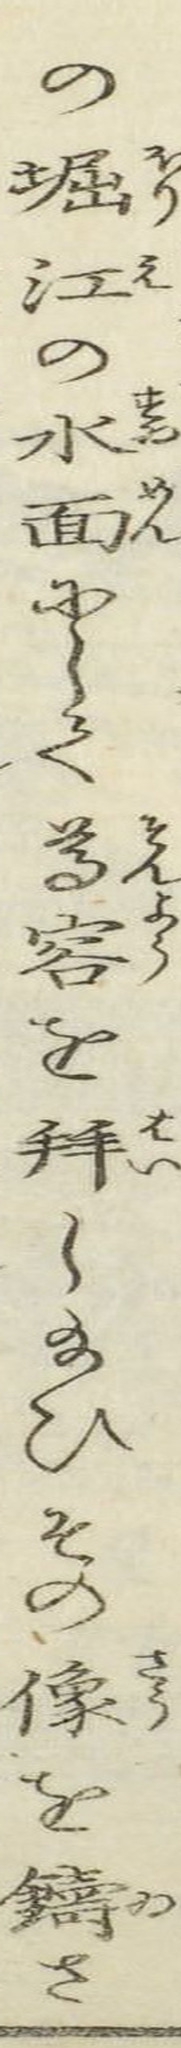の堀江の水面にして尊容を拝し給ひその像を鋳さ
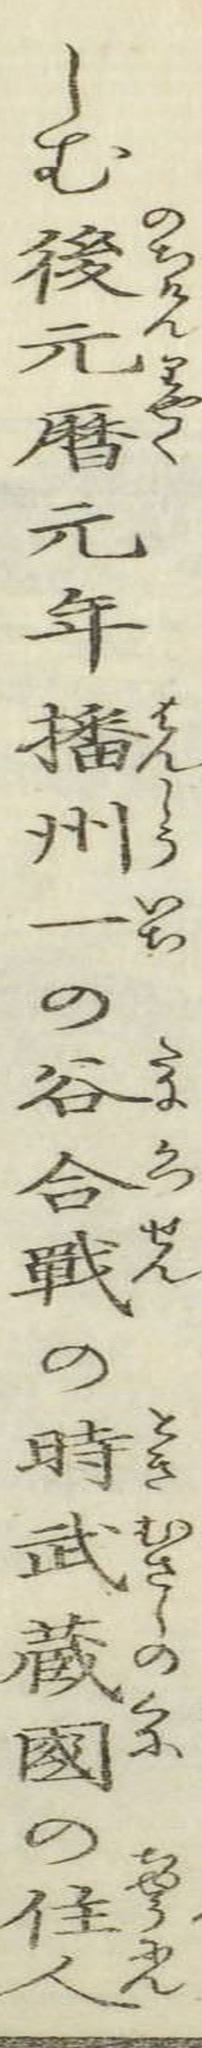しむ後元暦元年播州一の谷合戦の時武蔵國の住人
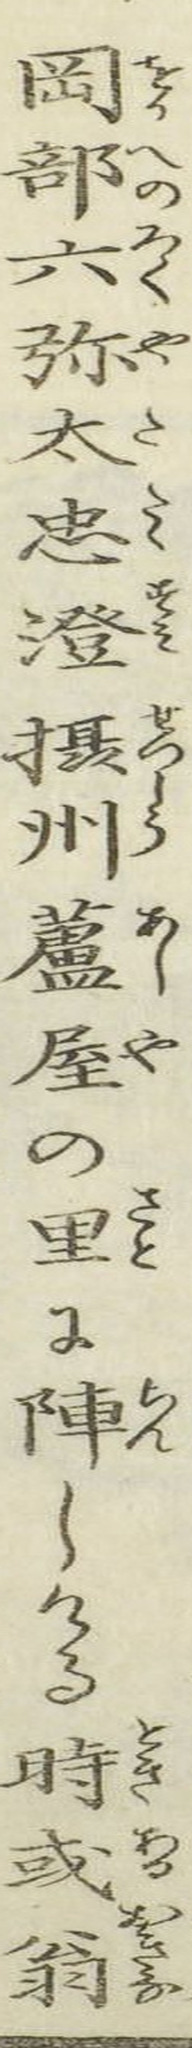岡部六弥太忠澄摂州蘆屋の里に陣しける時或翁
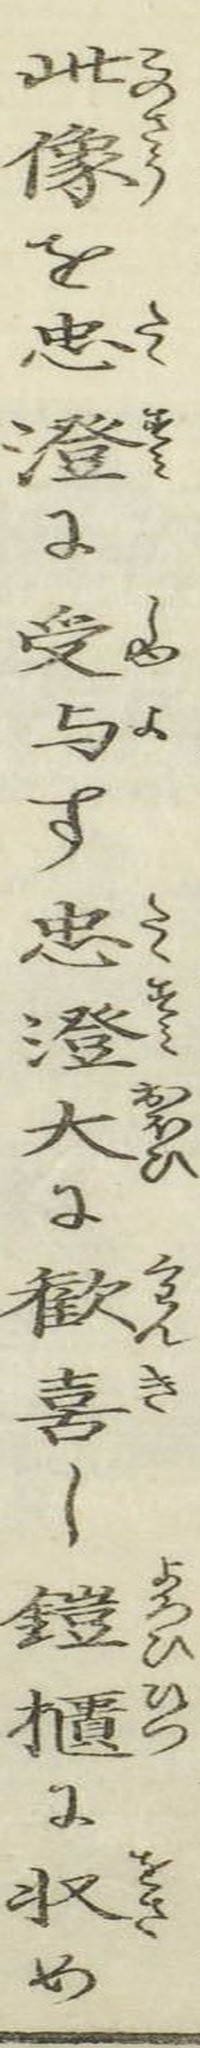此像を忠澄に受与す忠澄大に歓喜し鎧櫃に収め
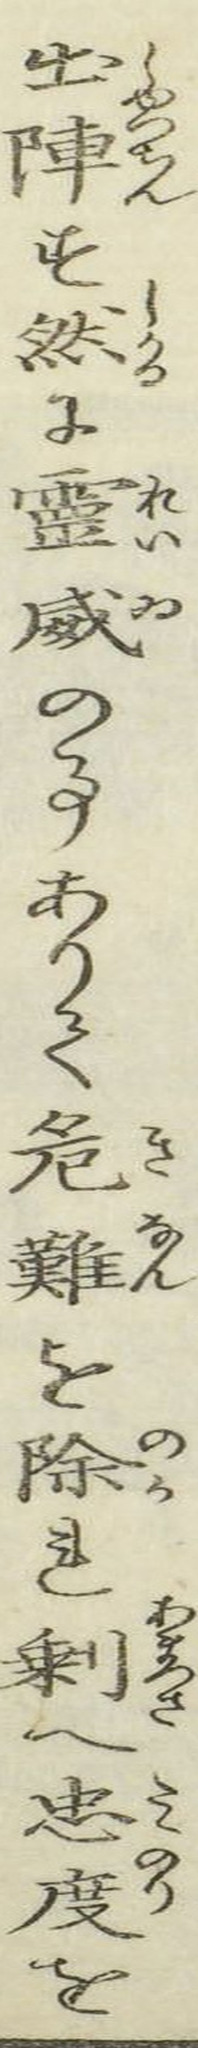出陣す然に霊威の事ありて危難を除れ剰へ忠度を
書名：江戸名所図会 20巻 巻之3
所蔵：東京学芸大学教育コンテンツアーカイブ
